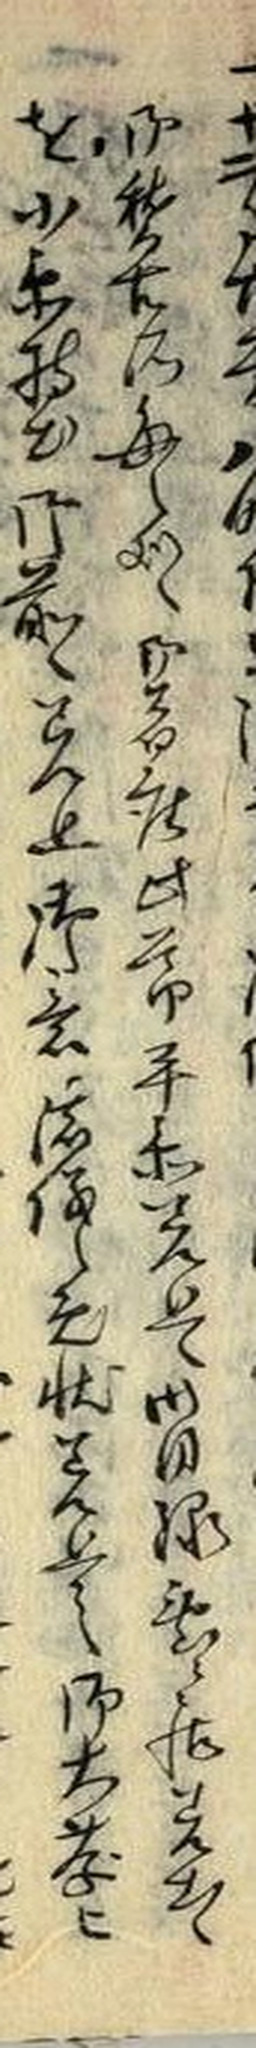を小兵衛持出御前へ差上御意流儀之免状差上之御大慶被
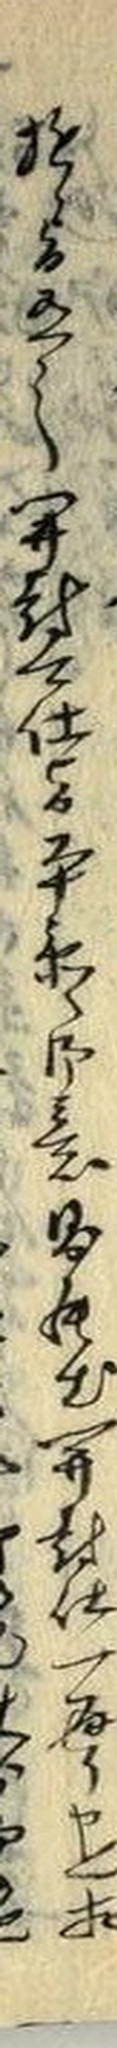遊候旨有之開封可仕旨平兵衛へ御意則罷出開封仕一通り申上相
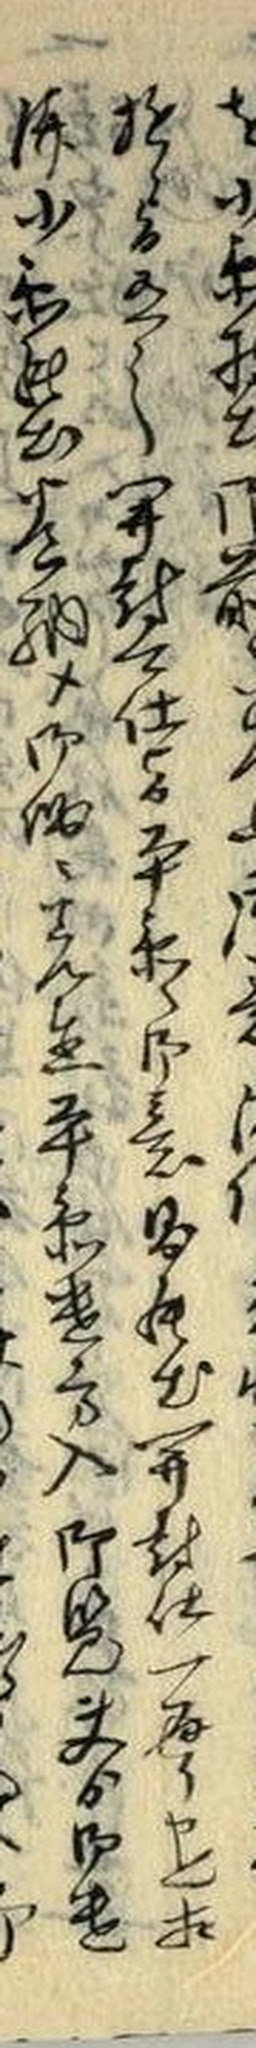済小兵衛罷出巻納メ御側ニ差置平兵衛遣方入御覧夫ゟ御遣
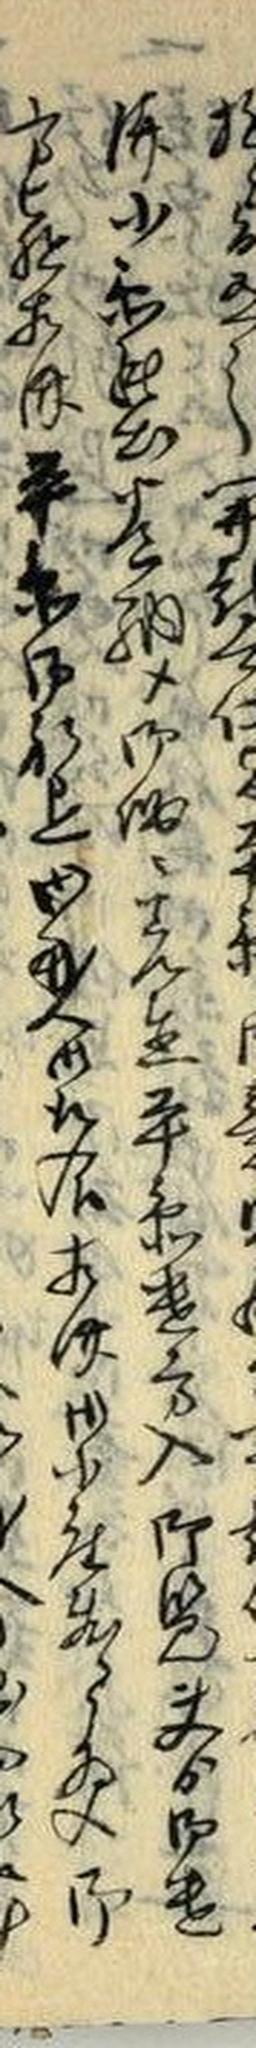方被遊相済平兵衛御礼申上御用人御取合相済御小座敷へ被為入御
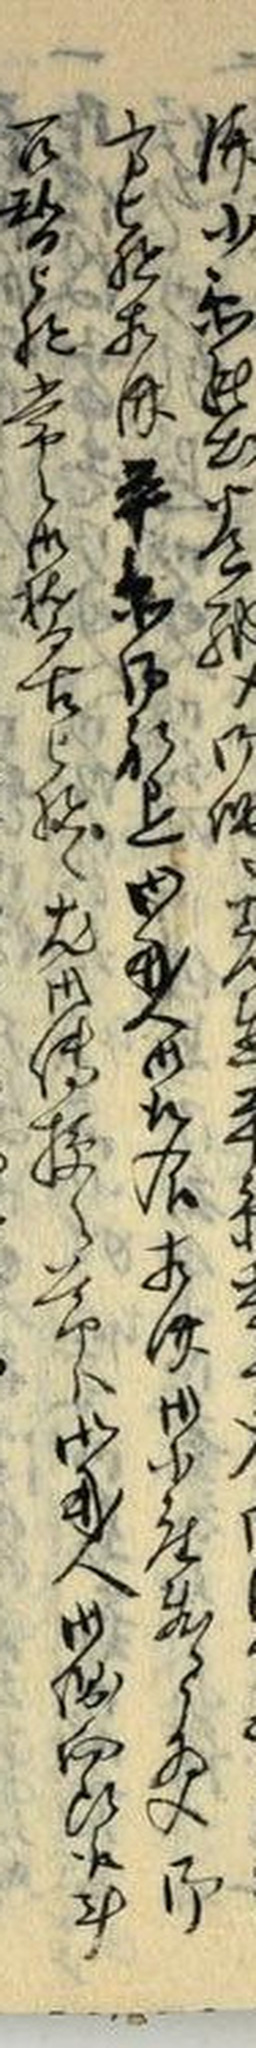召替被遊常之御稽古被遊候尤御伝授之節ハ御用人御側向頭取斗
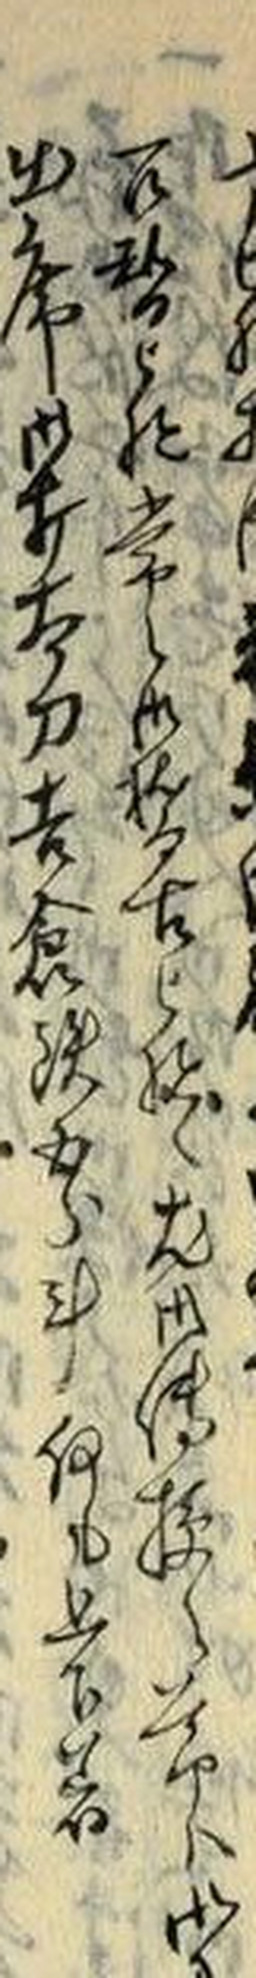出席御打太刀吉倉鉄五郎斗何も上下着
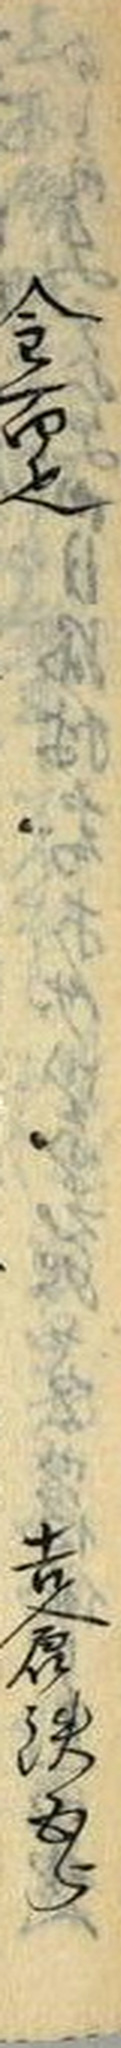金百疋吉倉鉄五郎
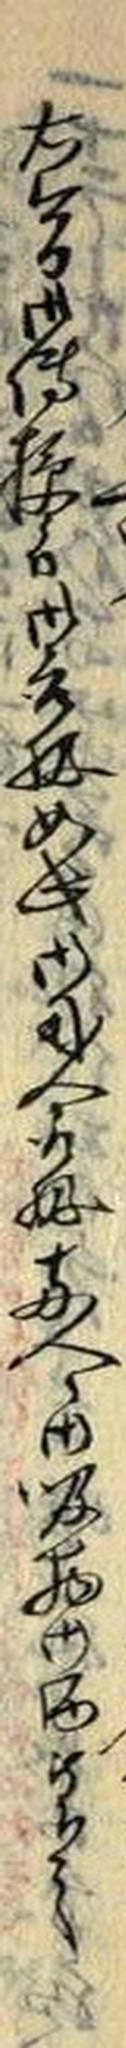右今日御伝授ニ付御取扱如此御用人取扱両人ニ御吸物御酒被下之
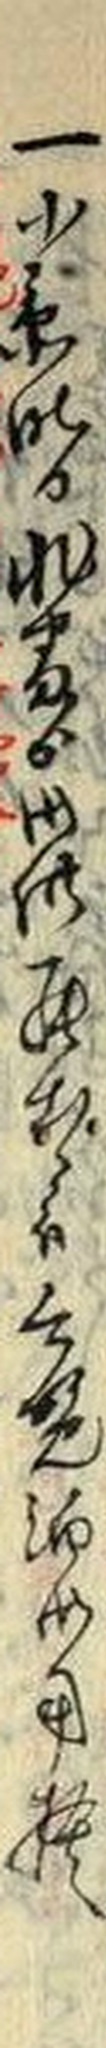一小兵衛昨日非番ゟ御供罷出候ニ付今晩泊御用捨
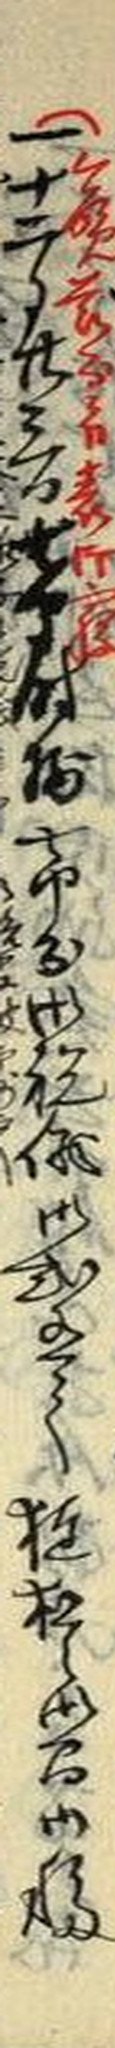一十二月廿三日七半時揃節分御祝儀御式有之韃靼之御間御移
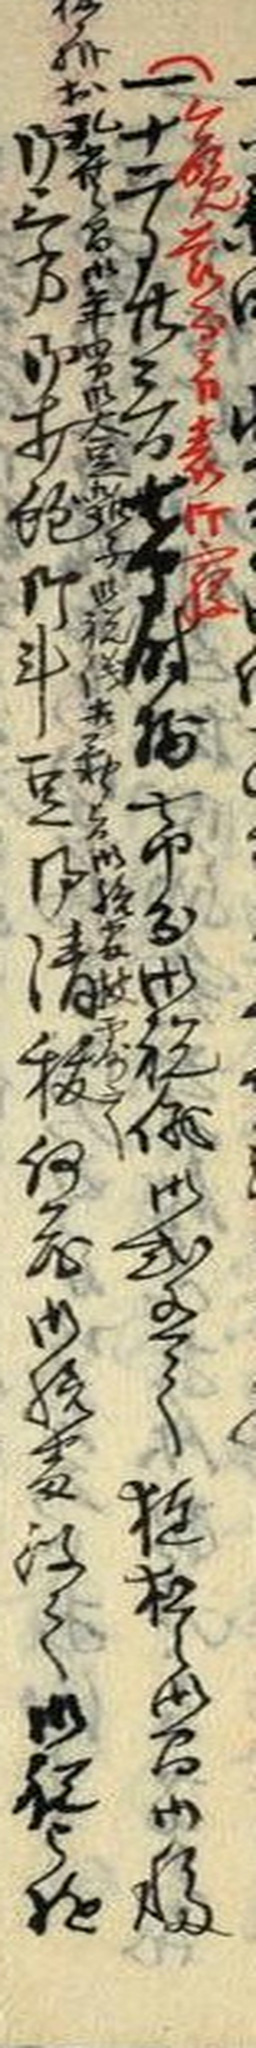御三方御打鮑御斗豆御清祓何茂御膳番役之御祝被遊
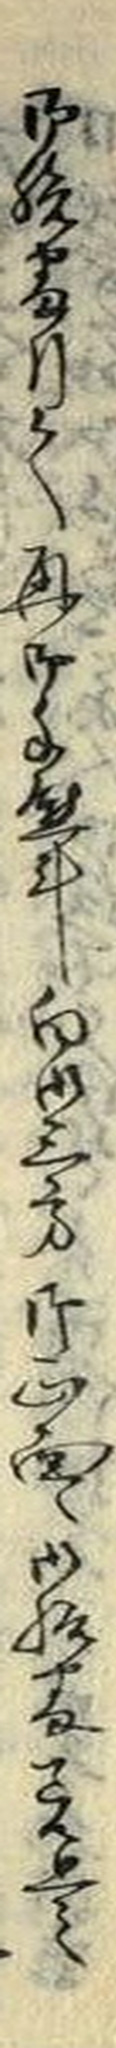御膳番引之再御手熨斗白御三方御正面へ御膳番差上之
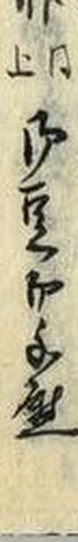上御豆御手慰
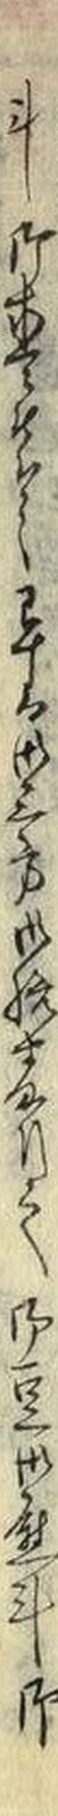斗御直ニ被下之畢而御三方御膳番引之御豆御熨斗御
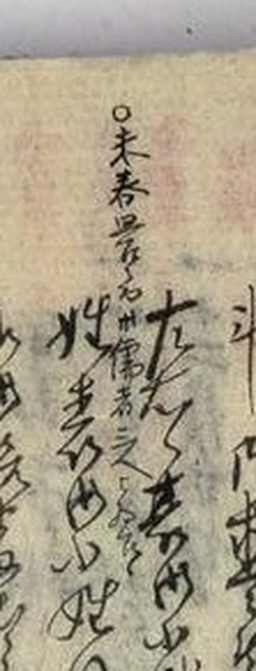〇未春思召ニ而御儒者三人被為召候
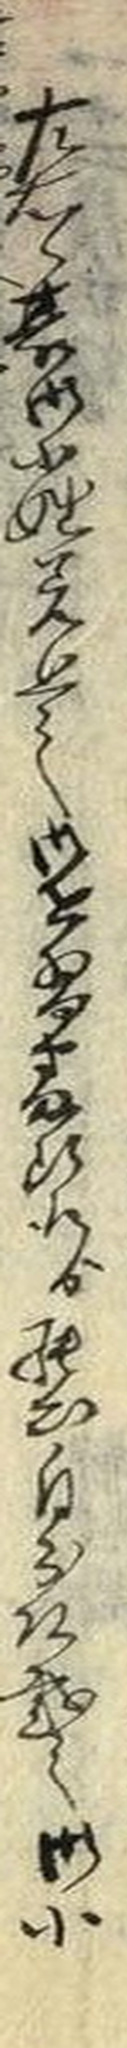左右之表御小姓差上之御近習番頭取ゟ罷出自分頂戴之御小
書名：少傅日録抄（斉承付側向頭取日記、在国）
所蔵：福井県文書館 Fukui Prefectural Archives
